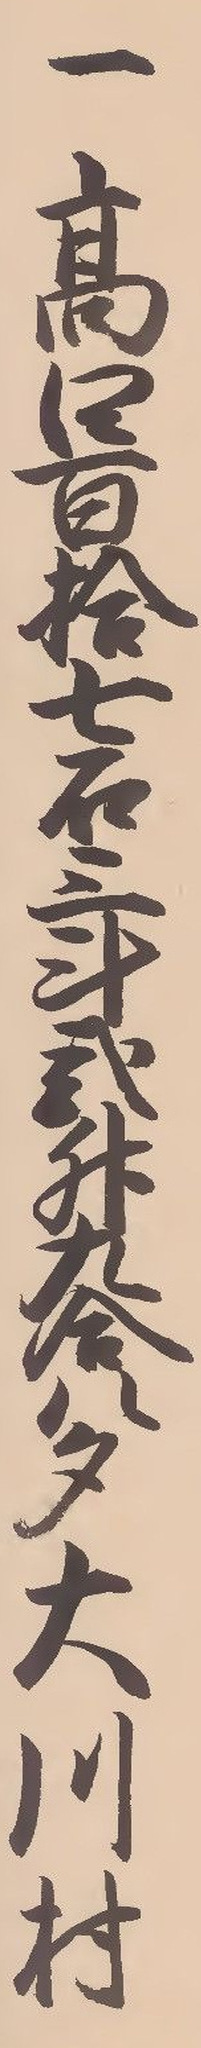一高四百拾七石三斗弐升九合八勺大川村
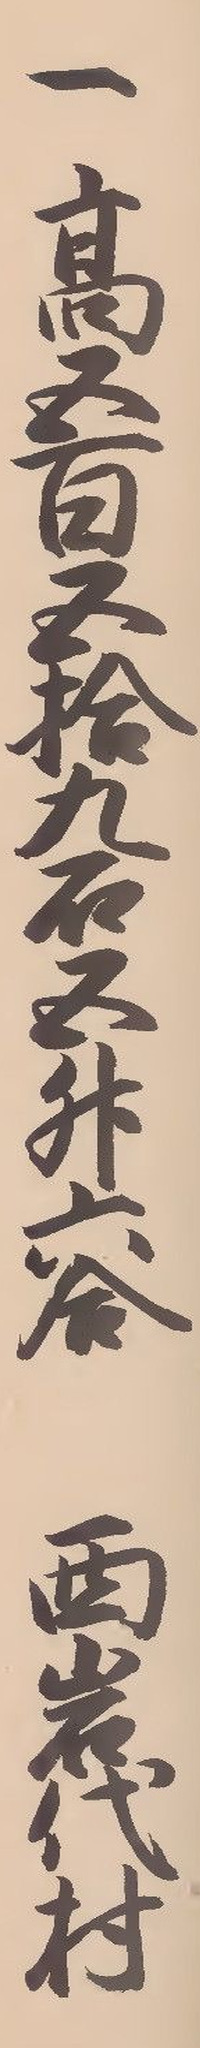一高五百五拾九石五升六合西岩代村
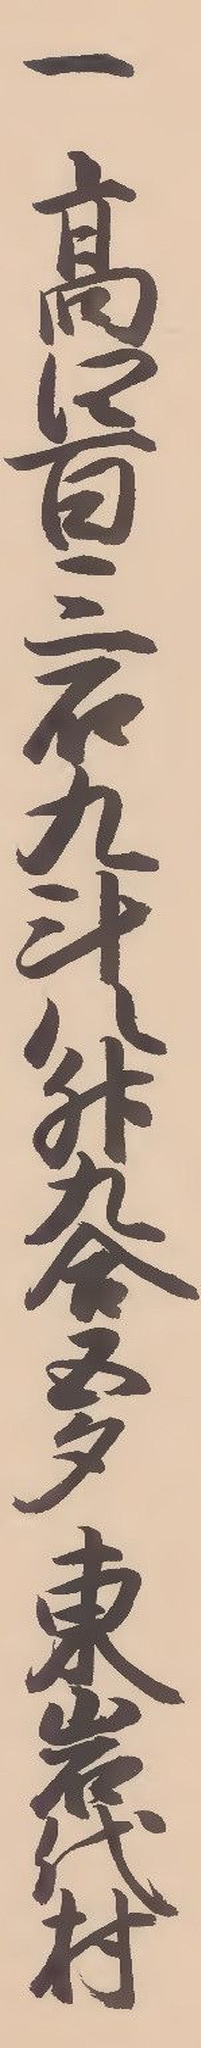一高四百三石九斗八升九合五勺東岩代村

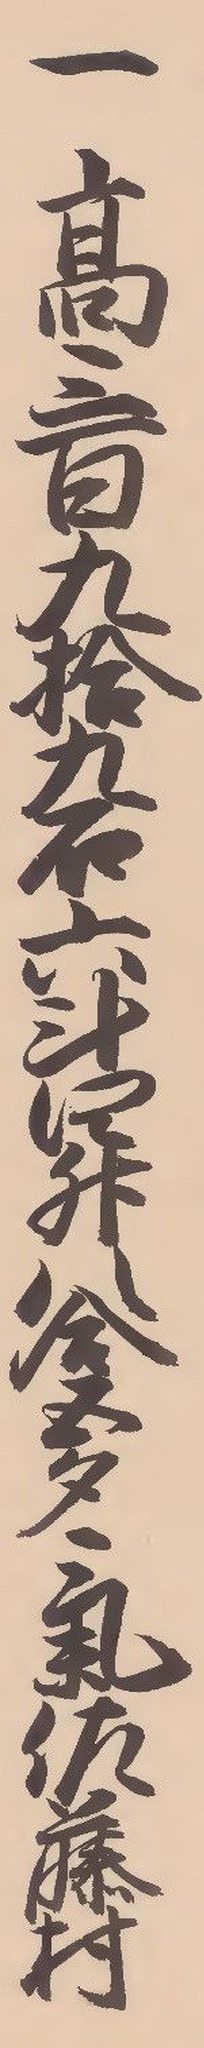一高三百九拾九石六斗四升八合五勺気佐藤村
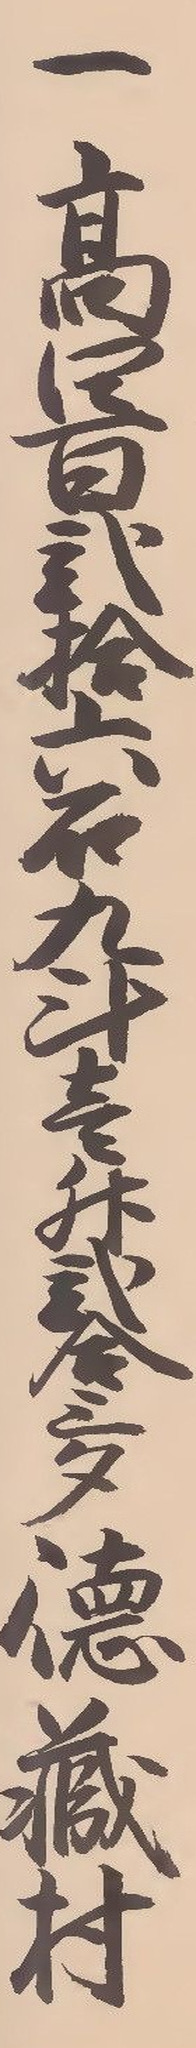一高四百弐拾六石九斗壱升弐合三勺徳蔵村
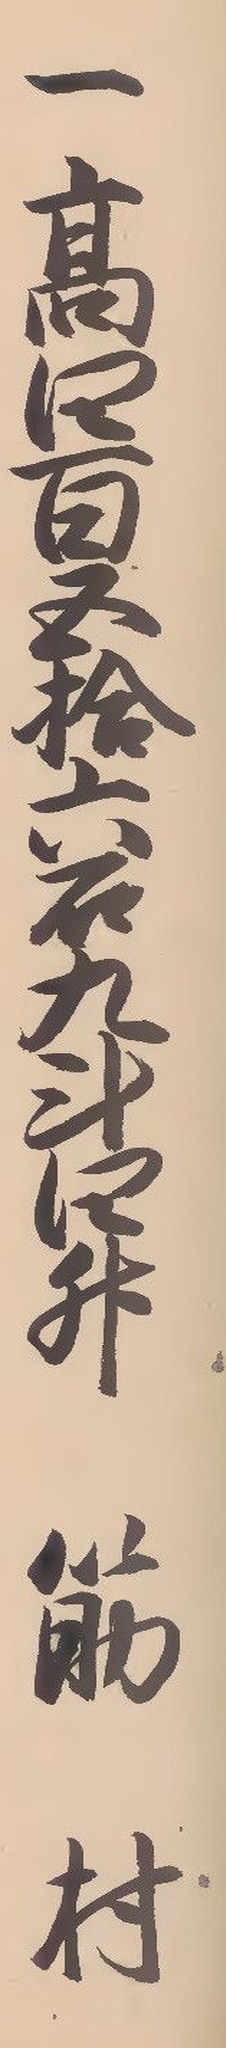一高四百五拾六石九斗四升筋村
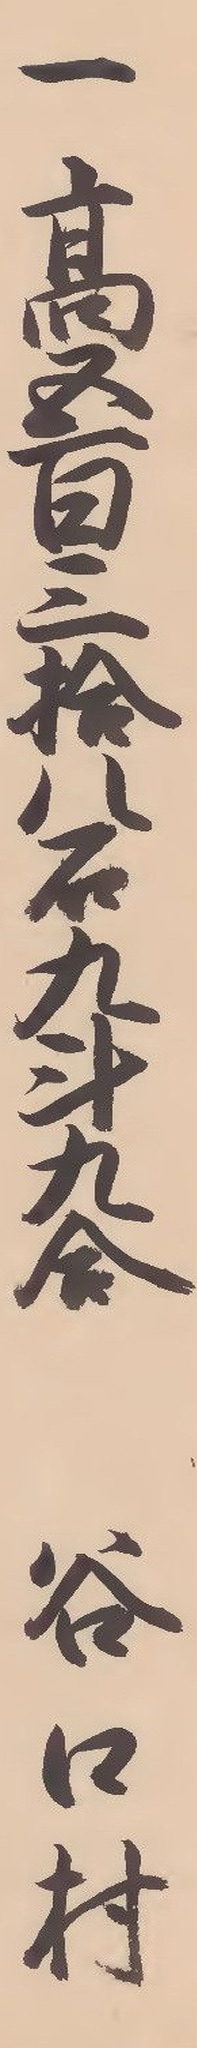一高五百三拾八石九斗九合谷口村
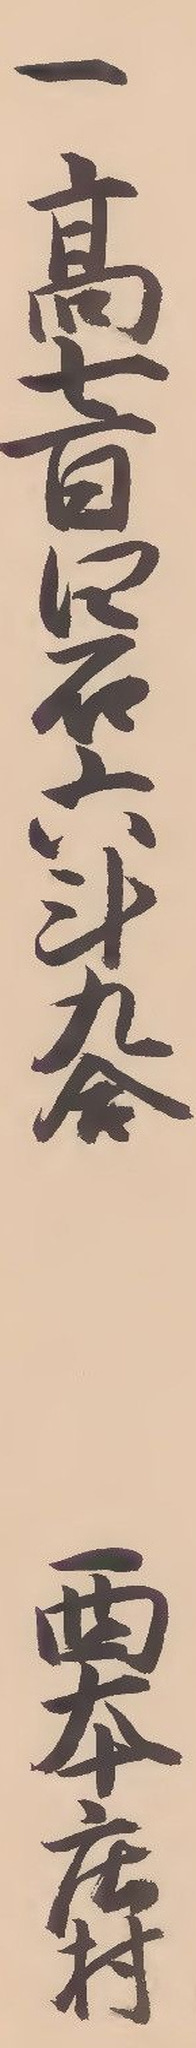一高七百四石六斗九合西本庄村

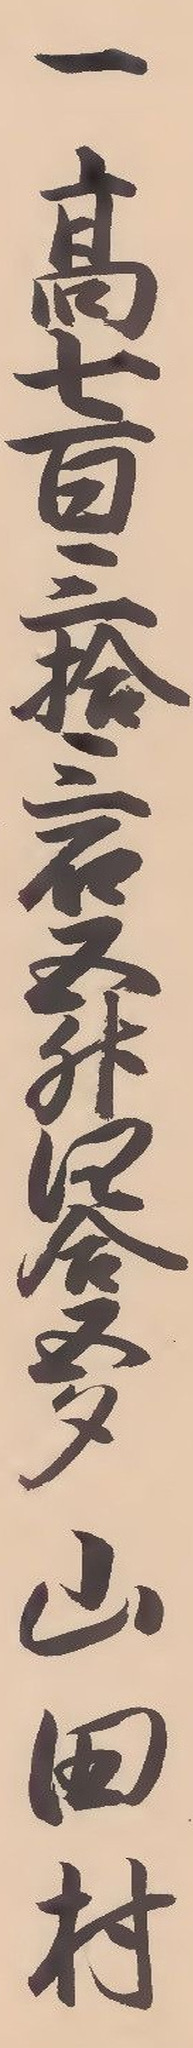一高七百三拾三石五升四合五勺山田村
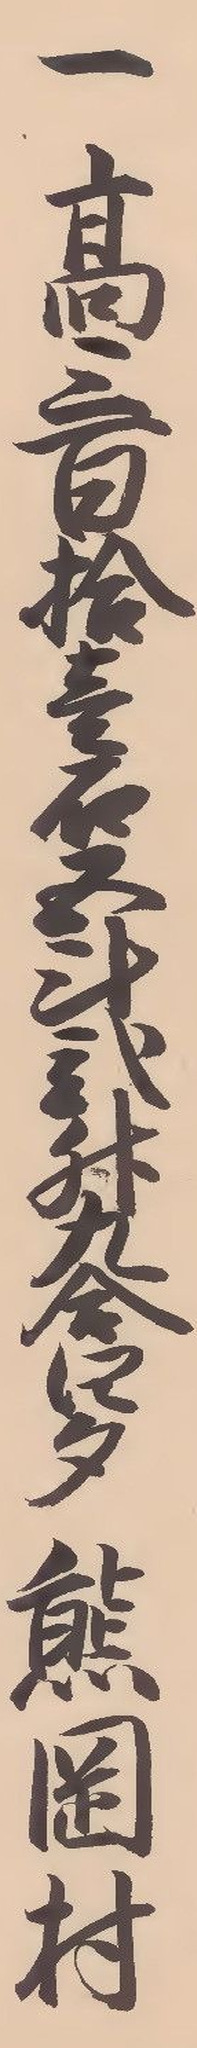一高三百拾壱石五斗弐升九合四勺熊岡村
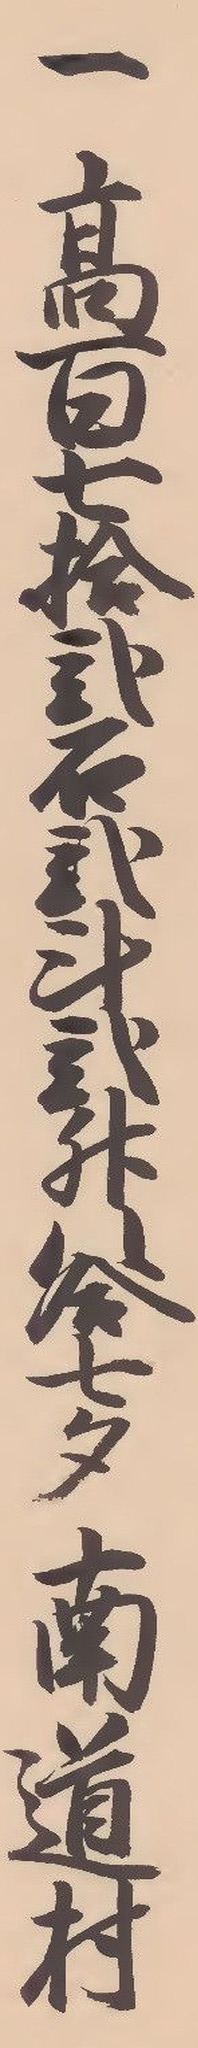一高百七拾弐石弐斗弐升八合七勺南道村
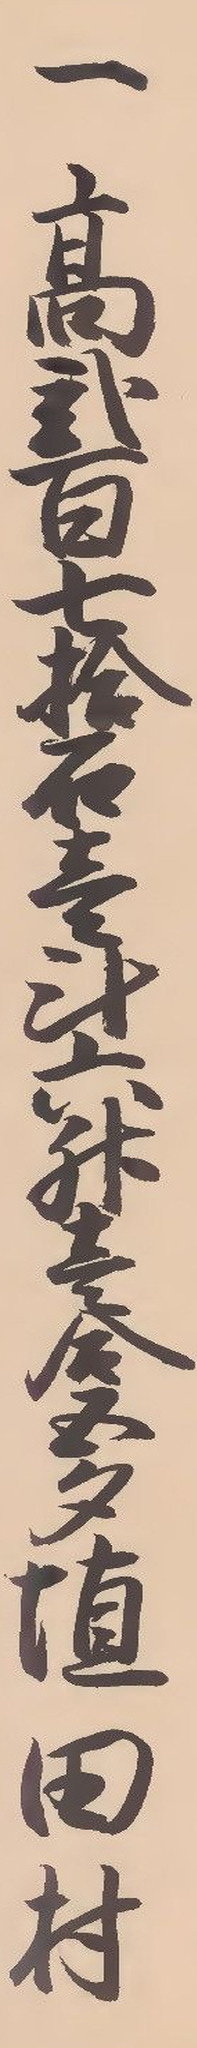一高弐百七拾石壱斗六升壱合五勺埴田村
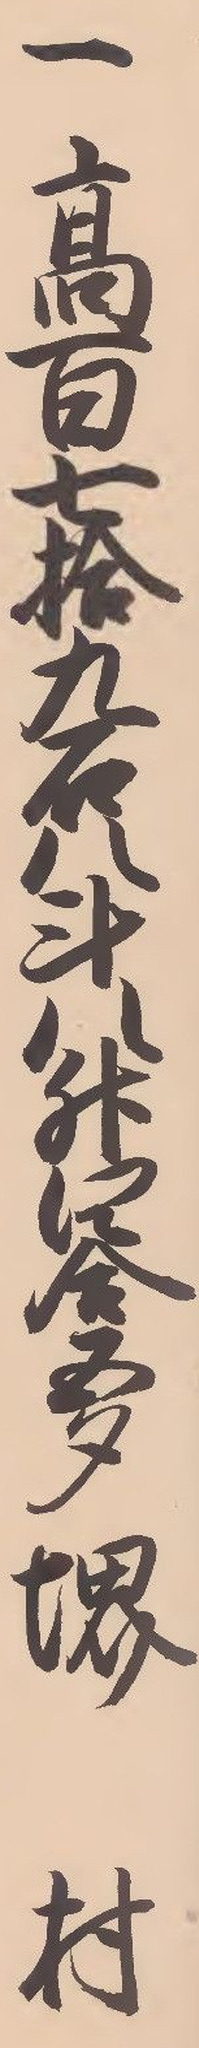一高百七拾九石八斗八升四合五勺堺村
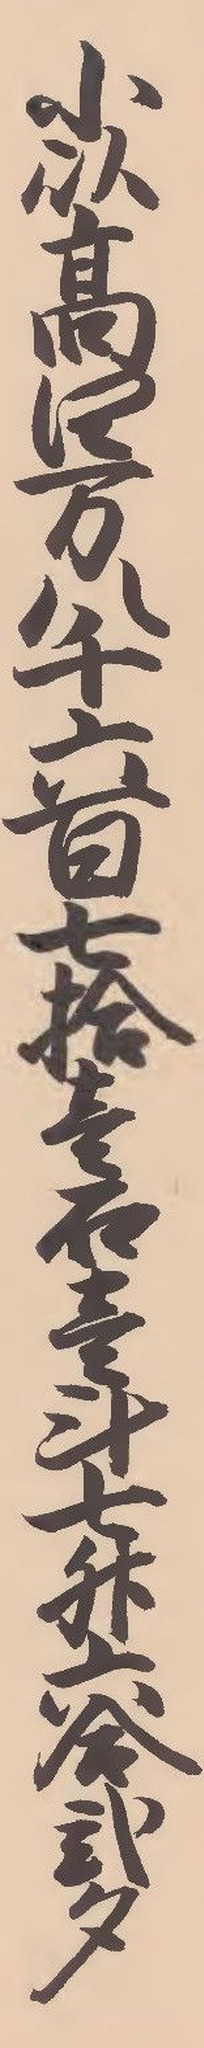小以高四万八千六百七拾壱石壱斗七升六合弐勺

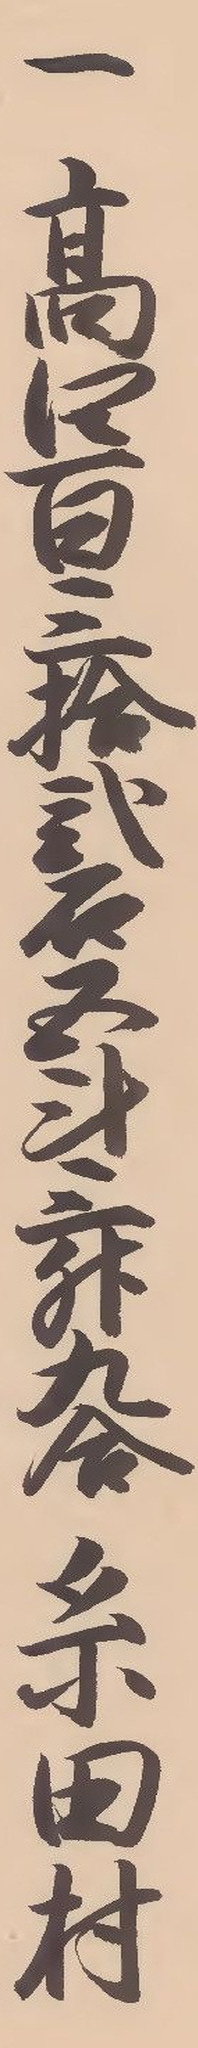一高四百三拾弐石五斗三升九合糸田村
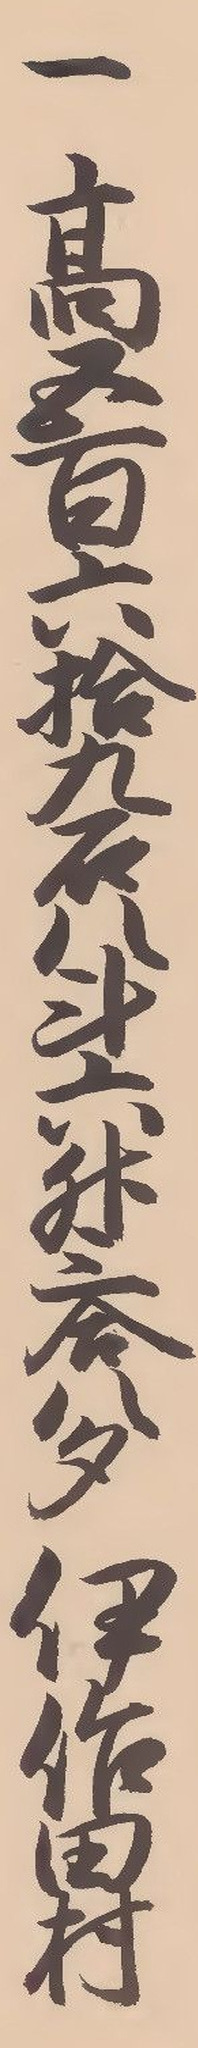一高五百六拾九石八斗六升三合八勺伊作田村
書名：紀伊国郷帳
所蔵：国立公文書館 National Archives of Japan
